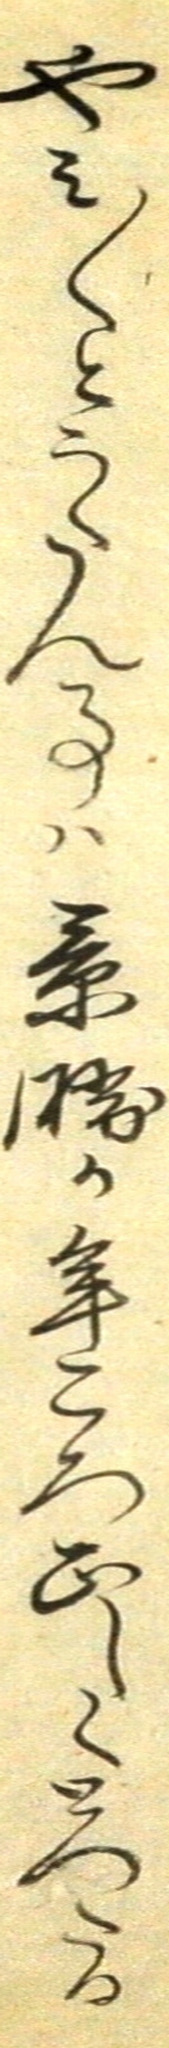やみ〳〵とうたん事は景勝か年ころ正しくとつたる
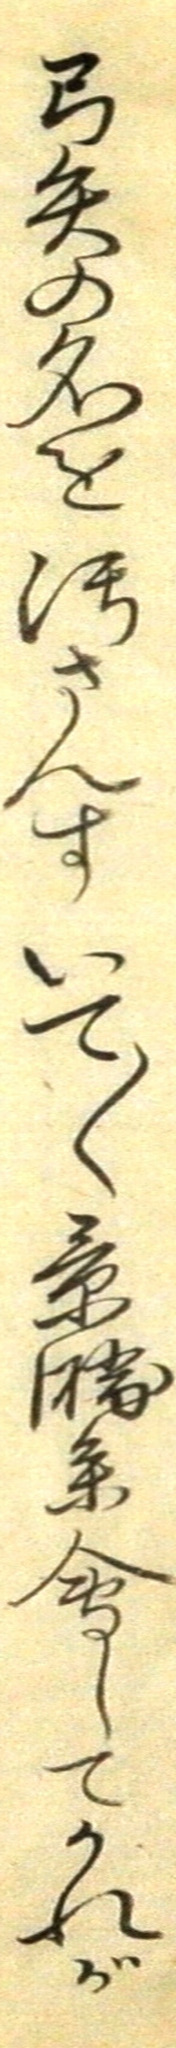弓矢の名を汚さんすいて〳〵景勝参会してかれが
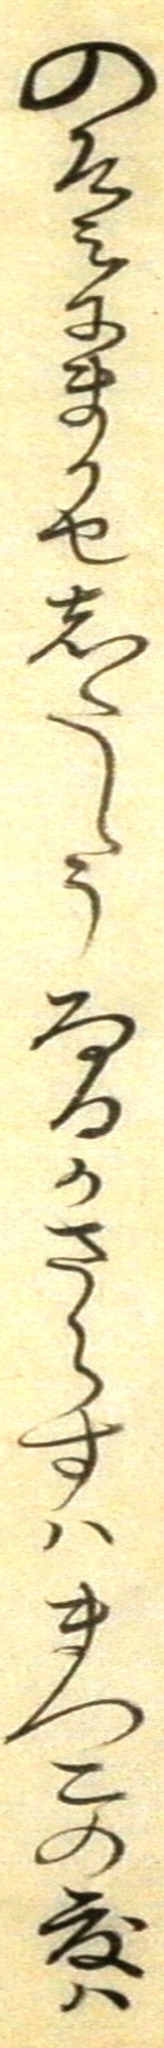のそみにまかせしたしうなるかさらすはまつこの度は
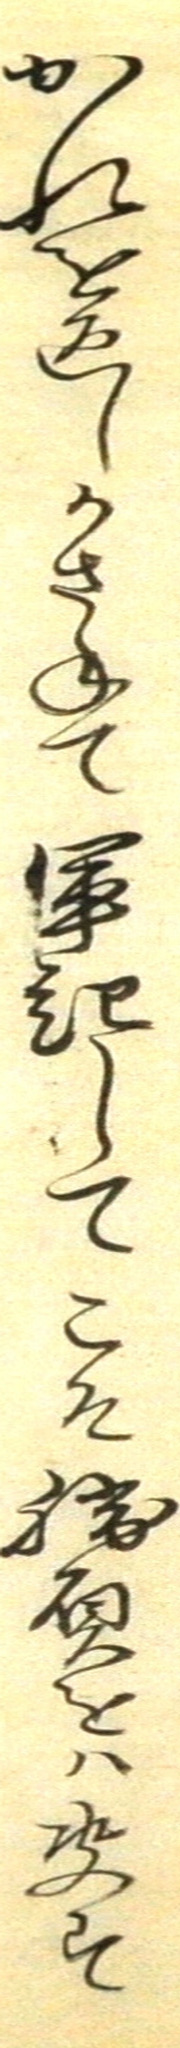かれを返しかさねて軍起してこそ勝負をは決す
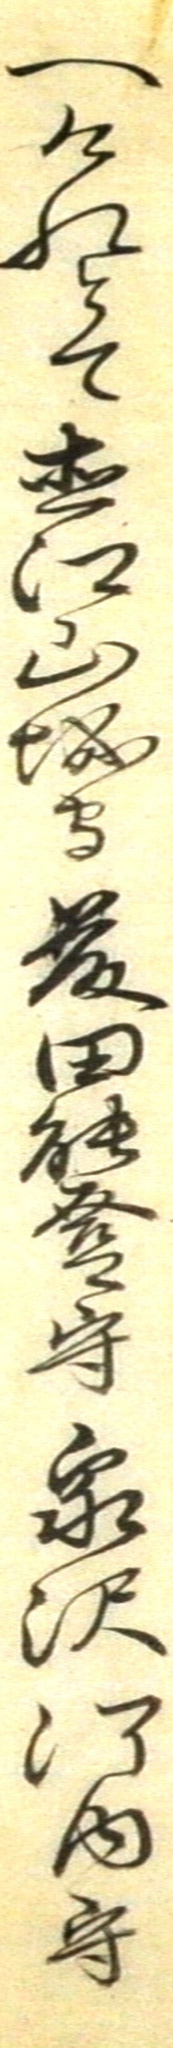へけれとて直江山城守藤田能登守泉沢河内守
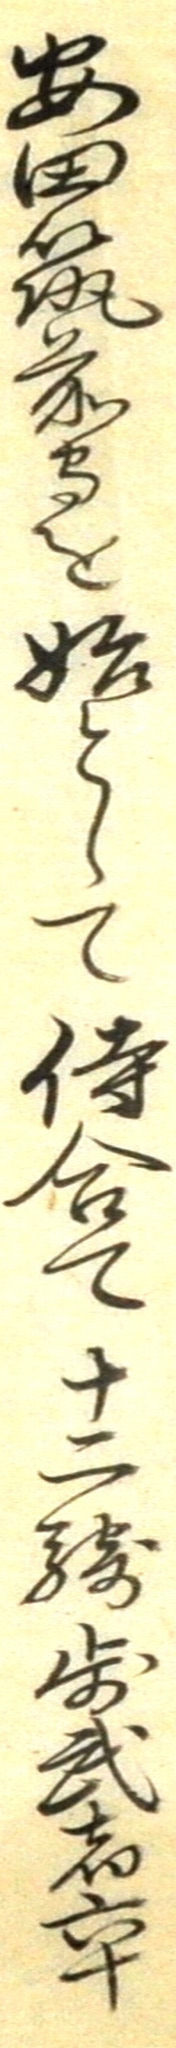安田筑前守を始として侍合て十二騎歩武者六十
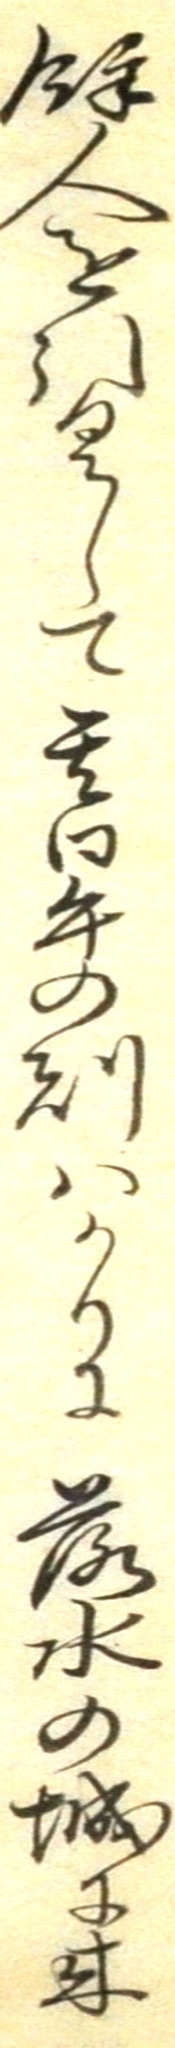余人を引具して其日午の刻はかりに落水の城に来
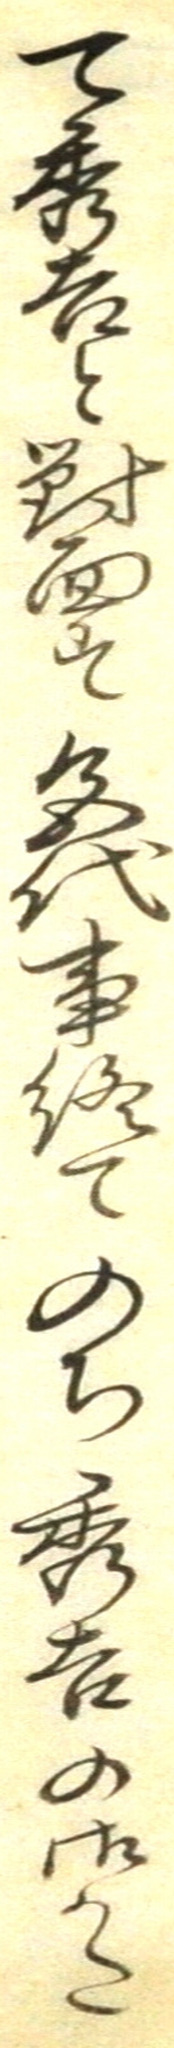て秀吉と対面す色代事終てのち秀吉の御かた
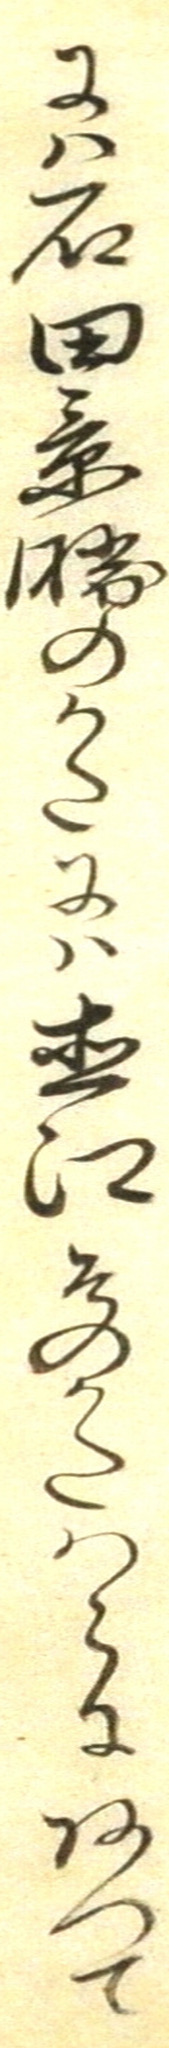には石田景勝のには直江そのかたはらにあつて
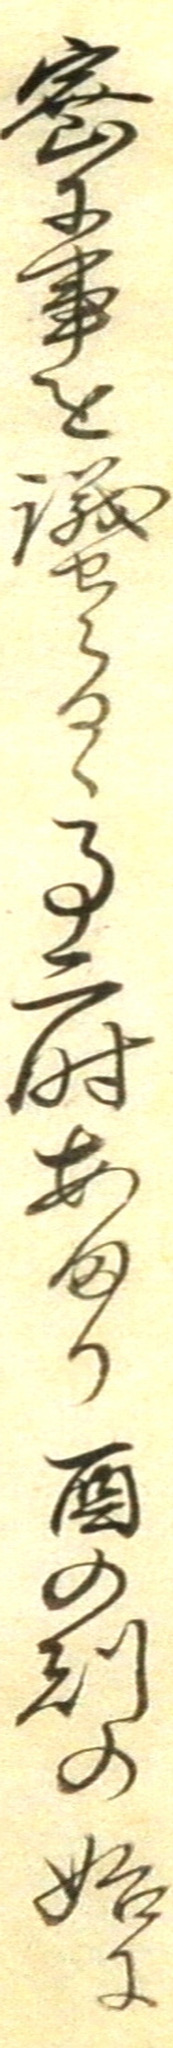密に事を議せらるゝ事二時あまり酉の刻の始に
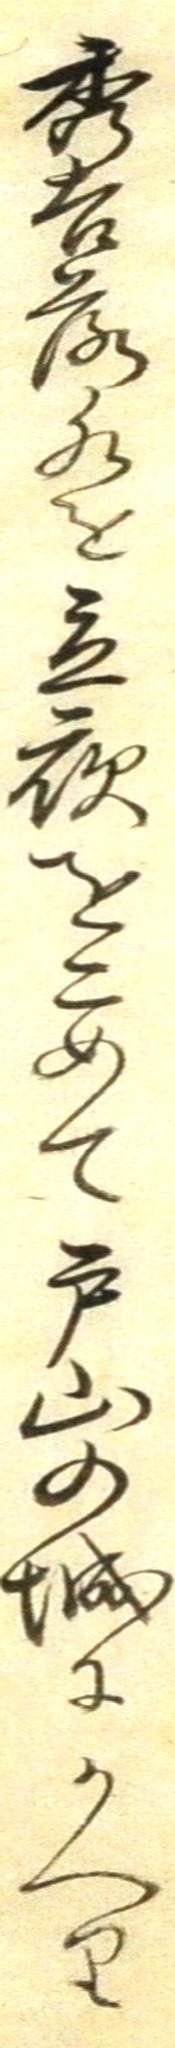秀吉落水を立夜をこめて戸山の城にかへり
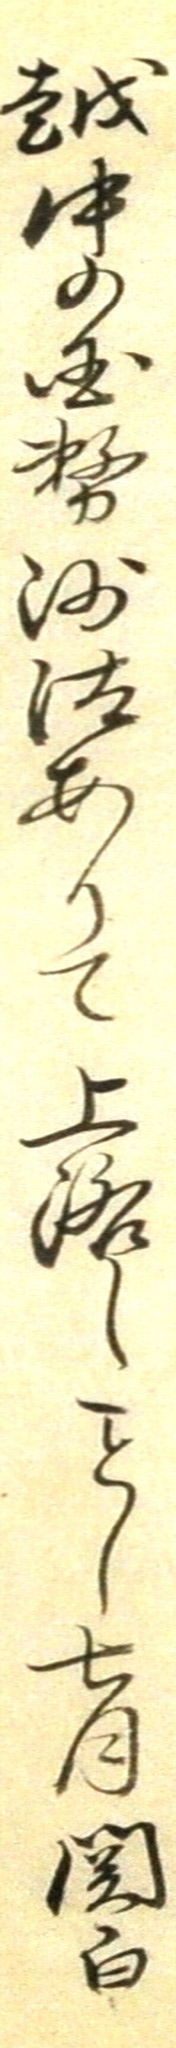越中の国勢沙汰ありて上洛しことし七月関白
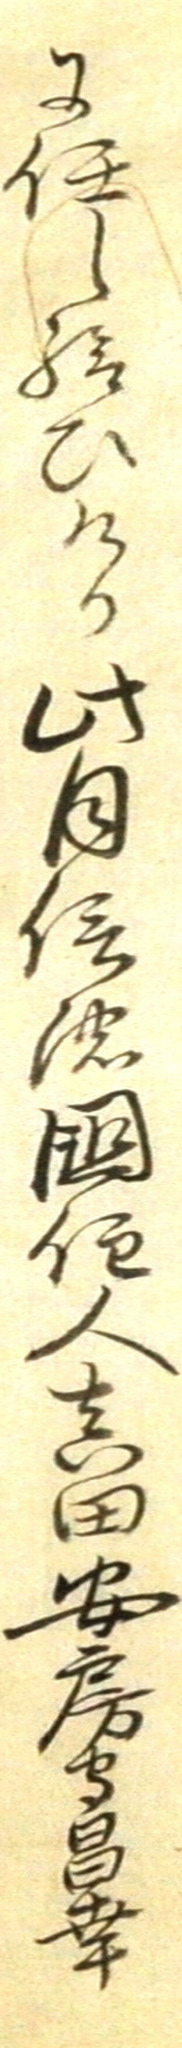に任し給ひけり此月信濃国住人真田安房守昌幸
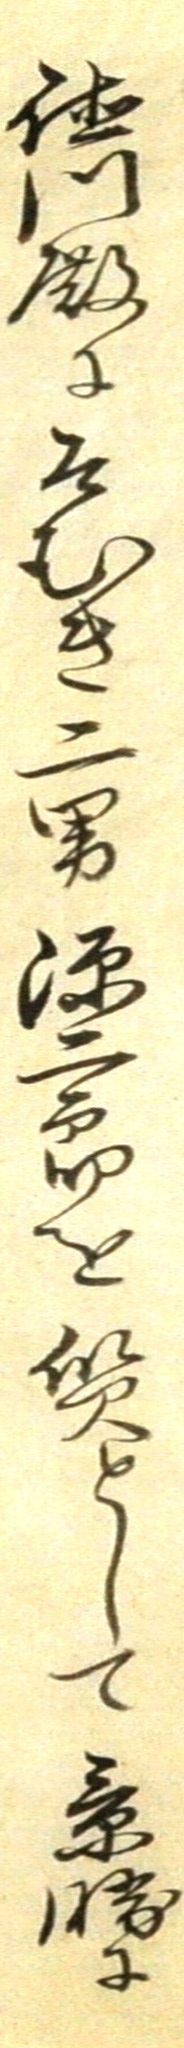徳川殿にそむき二男源二郎を質として景勝に
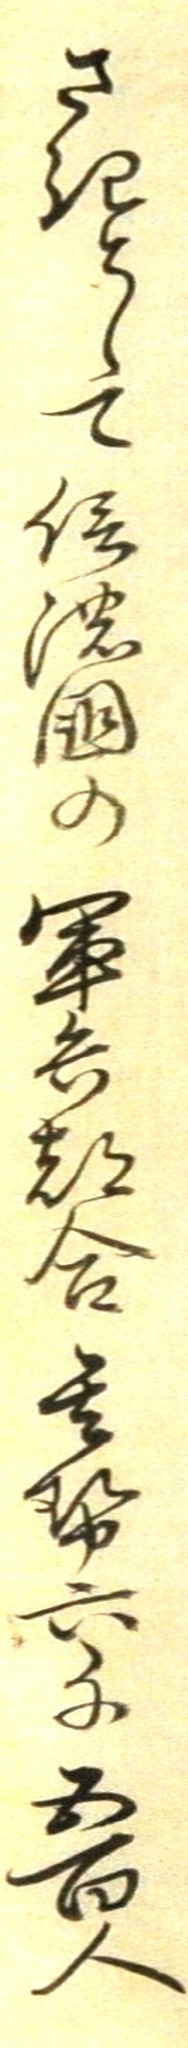さきとして信濃国の軍兵都合其勢六千五百人

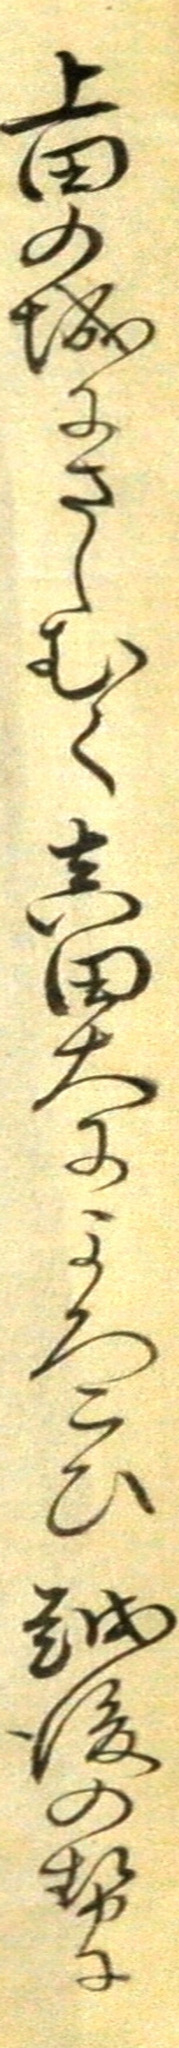上田の城にさしむく真田大によろこひ越後の勢に
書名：藩翰譜（八・下）
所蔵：伊那市立高遠町図書館・合同会社AMANE
